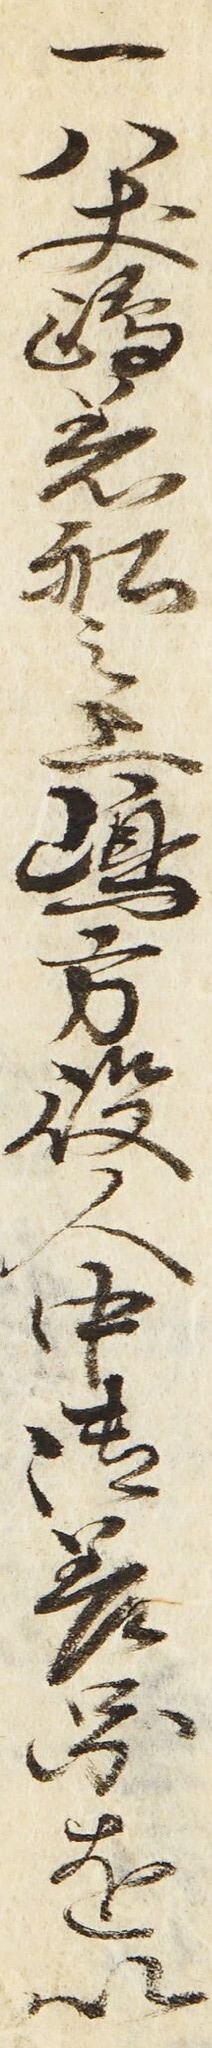一八丈嶋着船之上島方役人中御差図を以
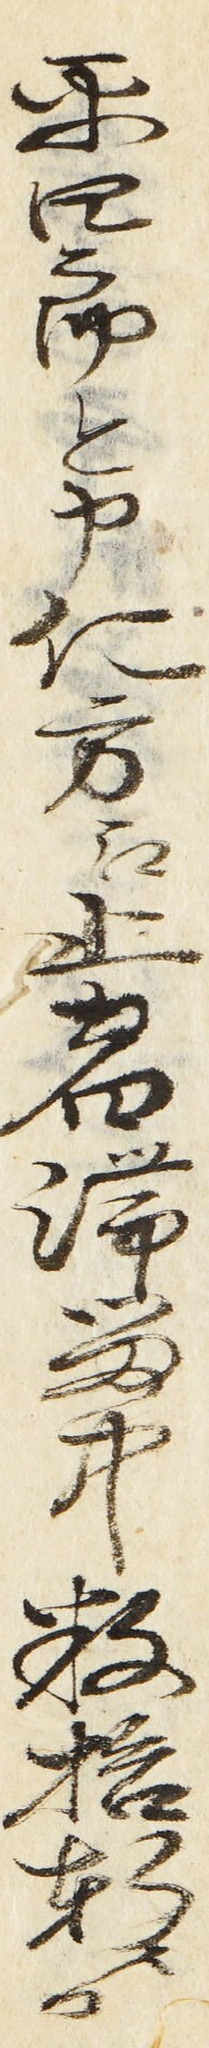平四郎と申仁方江止宿滞留中数拾軒ゟ
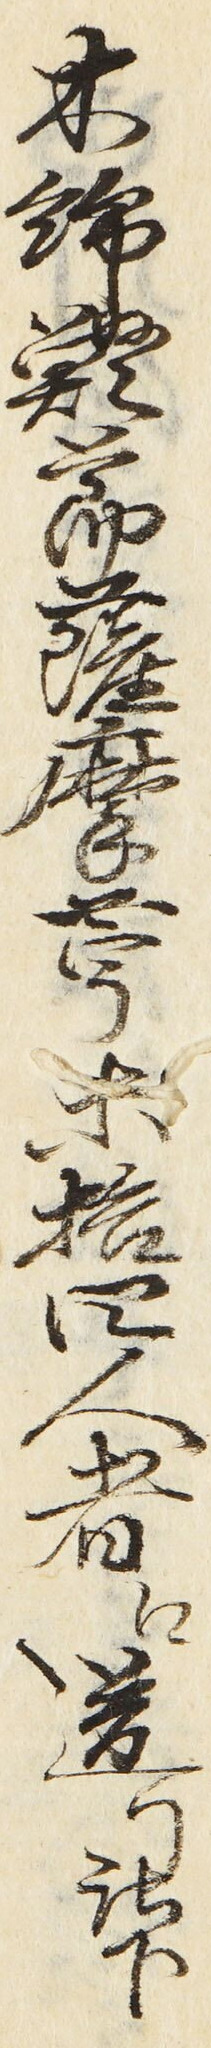木綿鰹節薩摩苧等拾四人者江送り被下
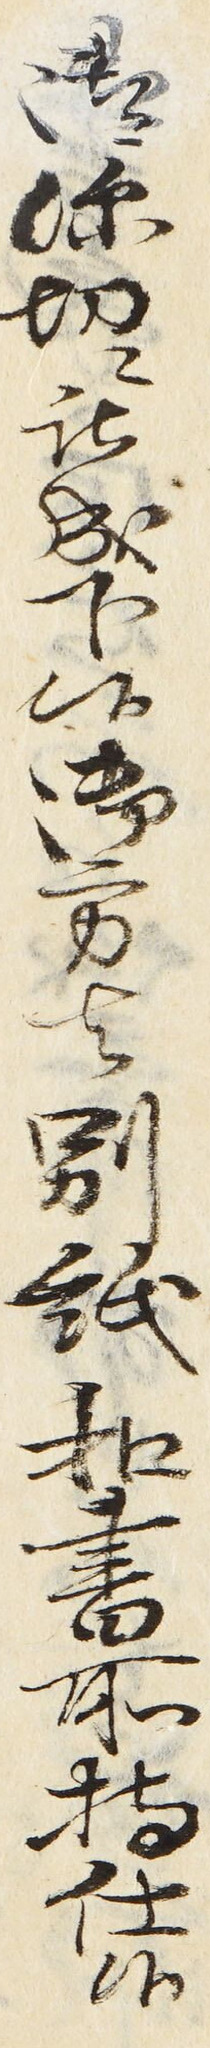御深切ニ被成下候御方者別紙控書所持仕候
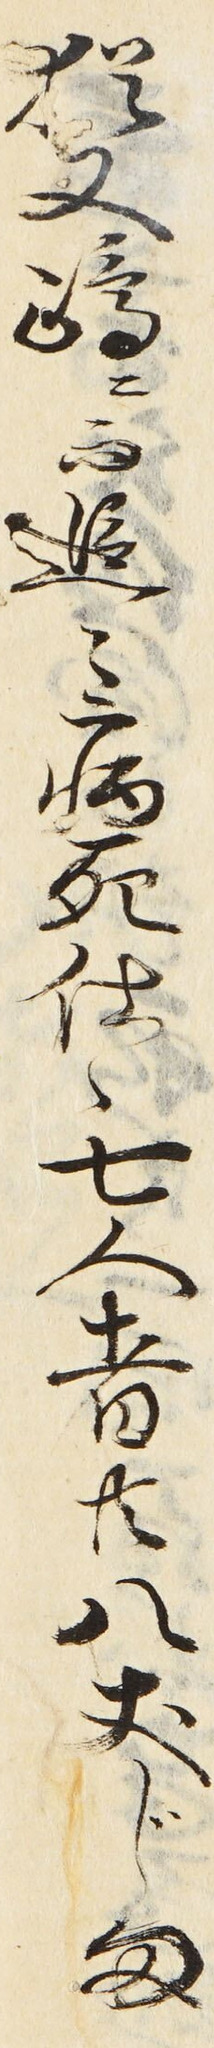猶又嶋ニ而追々病死仕候七人者共八丈じま
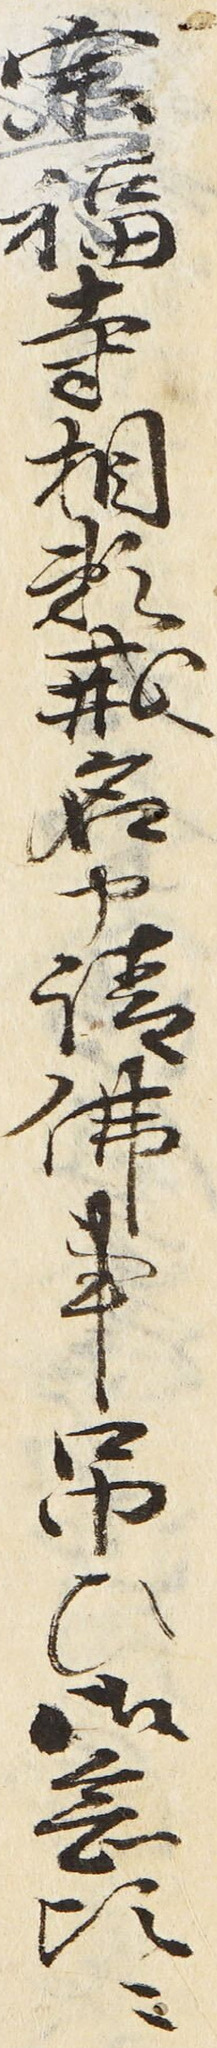宗福寺相頼戒名申請仏事弔ひ御念頃ニ
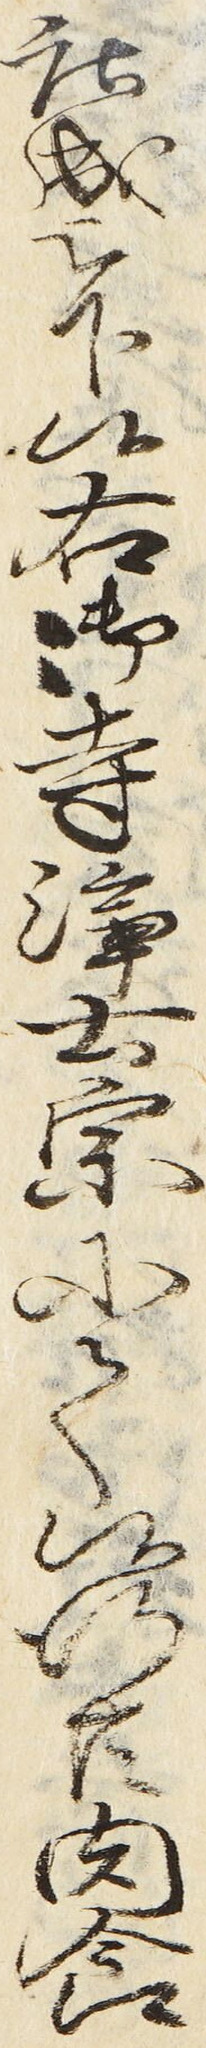被成被下候右御寺浄土宗にて候得共肉食
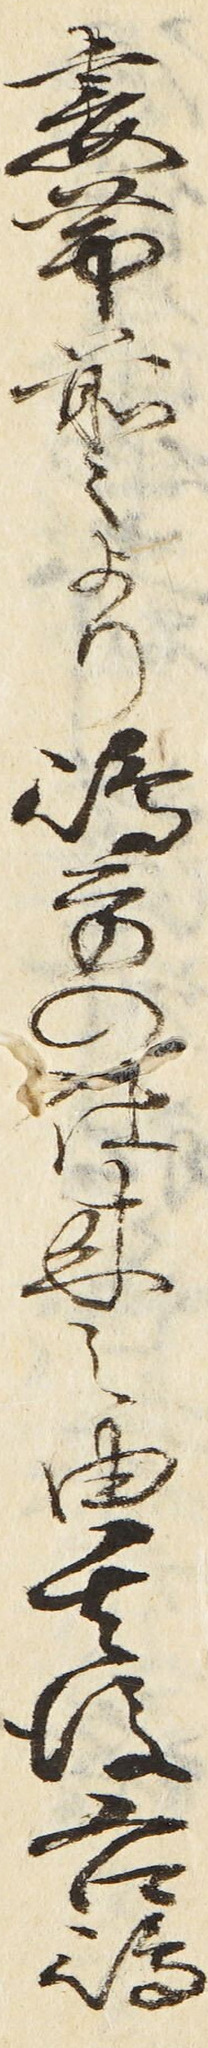妻帯前々より嶋方の仕来之由其後右嶋
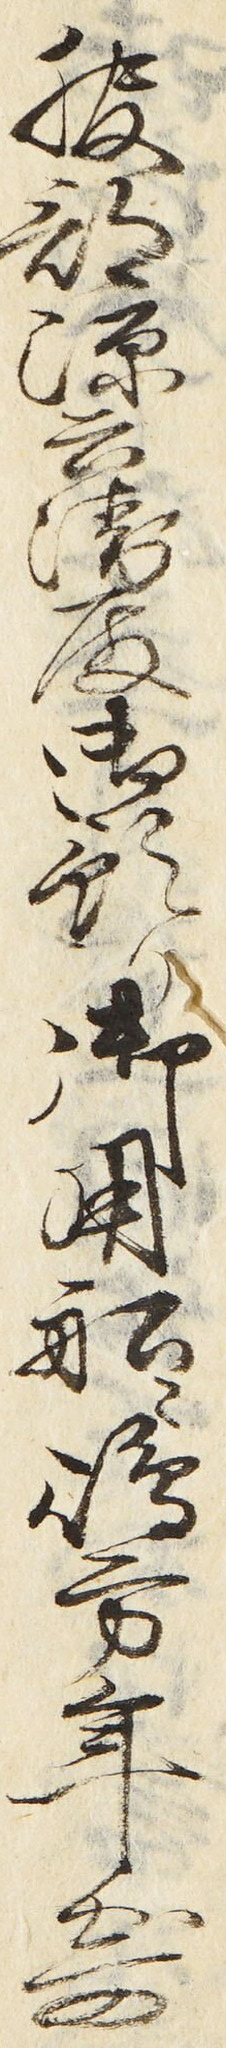服部源兵衛殿御預り御用船ニ嶋方年寄
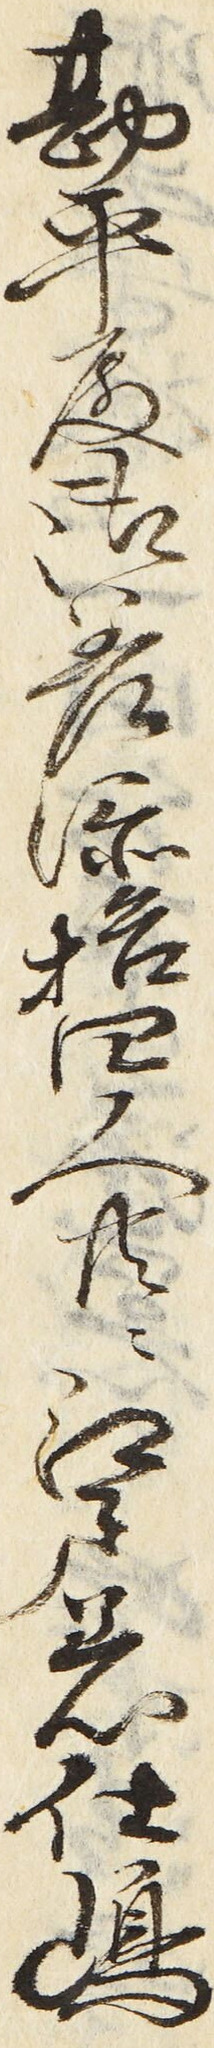勘平殿御差添拾四人共ニ江戸着仕嶋
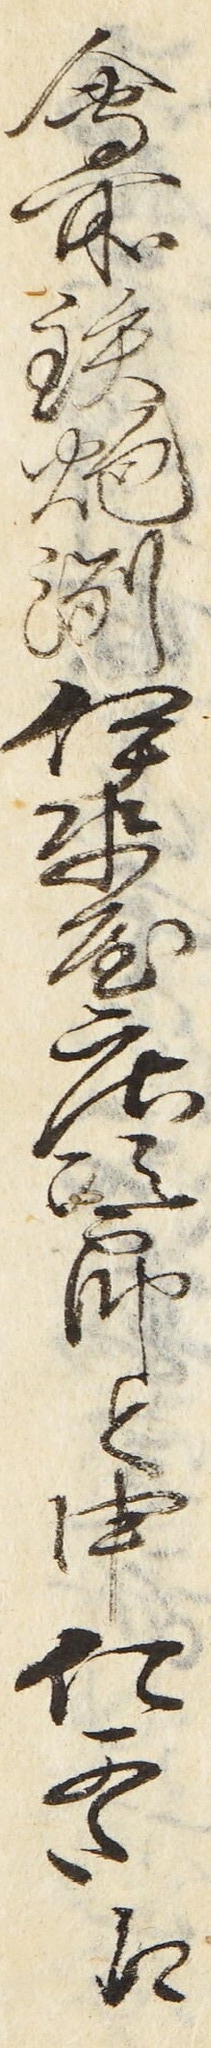会所鉄炮洲伊勢屋庄次郎と申仁かた江
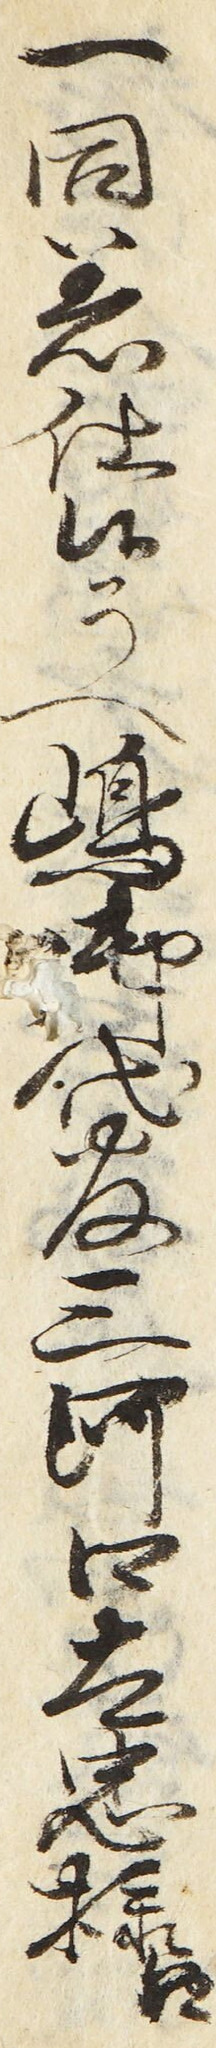一同着仕候うへ嶋御代官三河口太忠様江
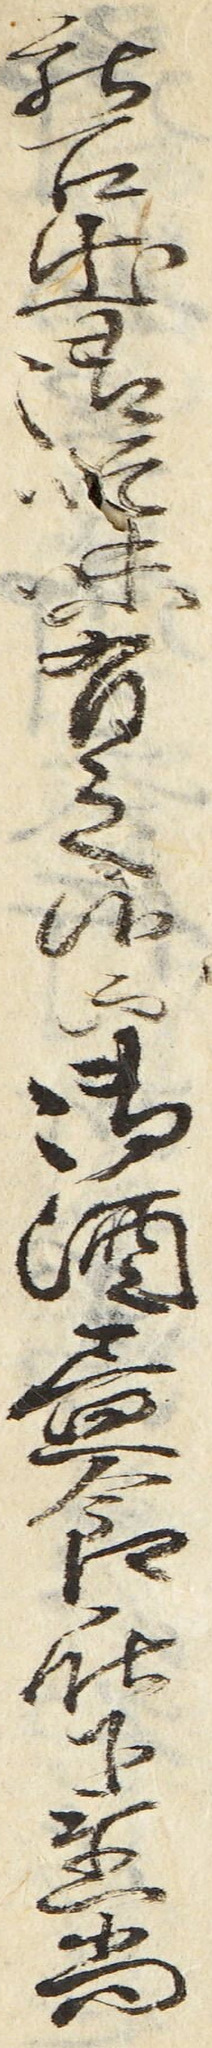被召出御吟味有之候而御酒昼食被下置尚

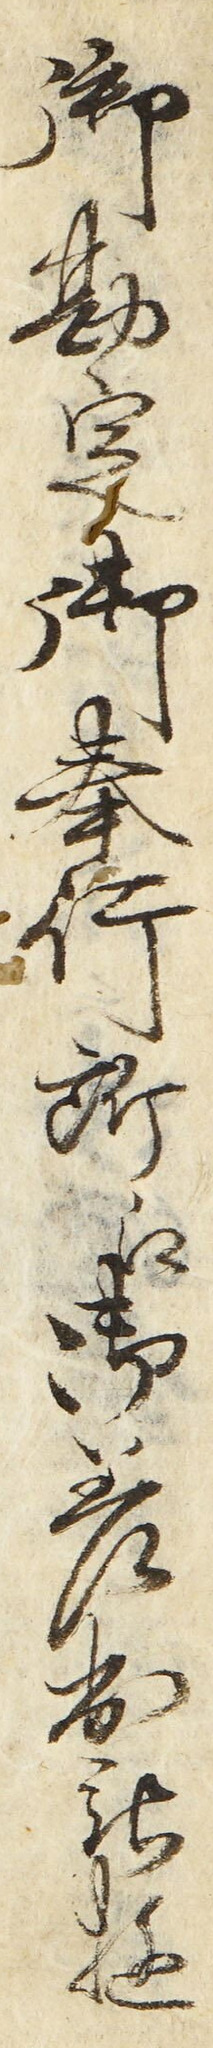御勘定御奉行所江御差出被遊
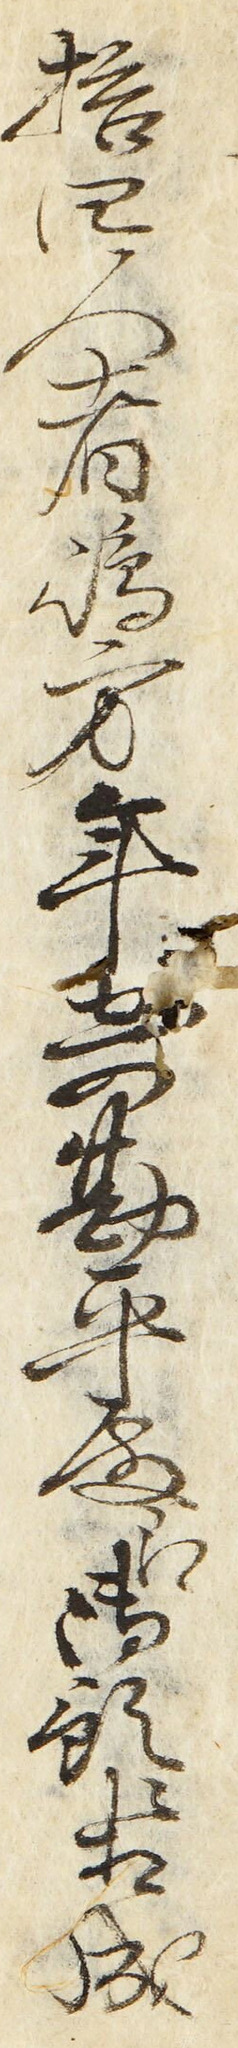拾四人者嶋方年寄勘平殿江御預ニ相成
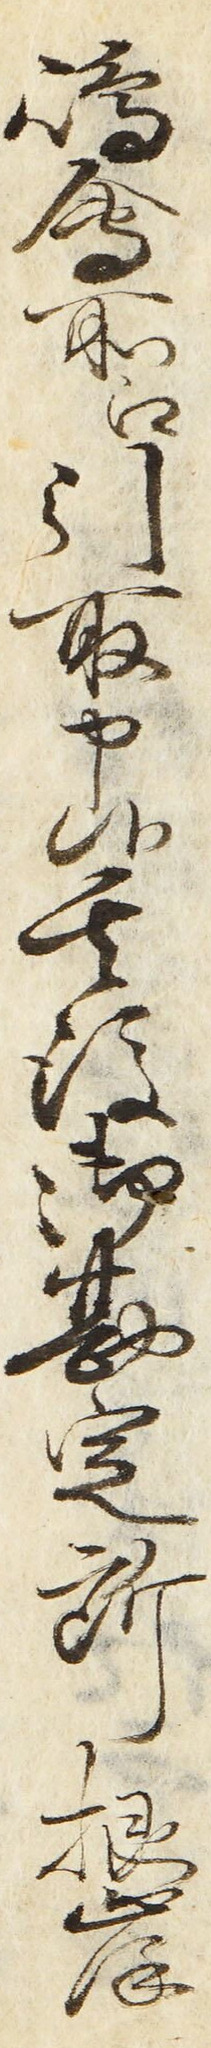嶋会所江引取申候其後御勘定所根岸
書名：漂流一件上書
